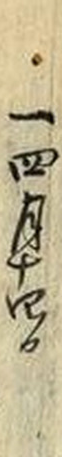一四月十四日
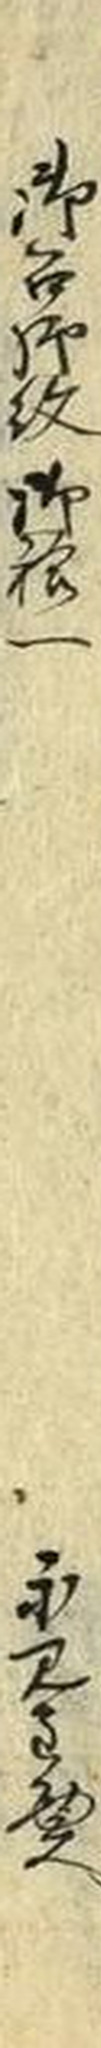御召御紋御袷一永見主殿
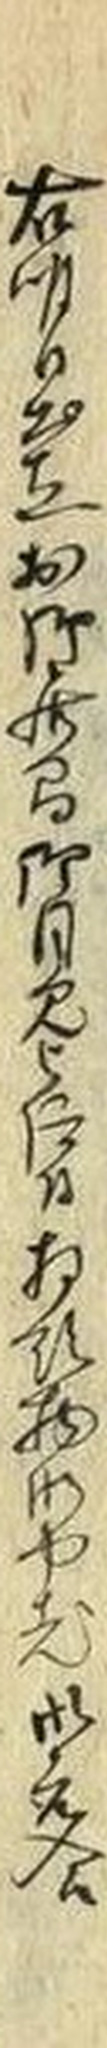右明日出立於御居間御目見被仰付拝領物御中老御取合
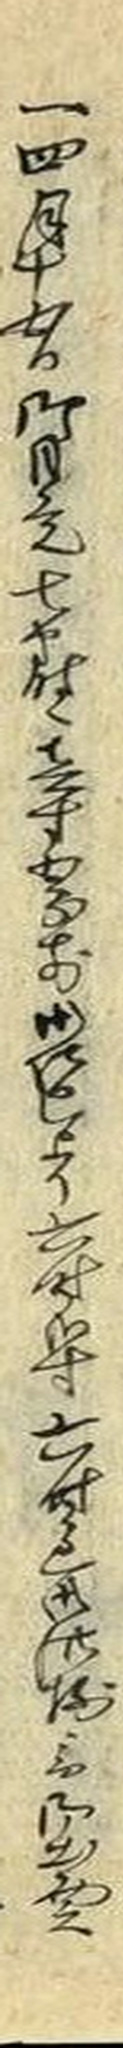一四月十五日御目覚七半時へ壱寸五分前御仕廻上り六時弐寸六時過御供揃ニ而御出殿
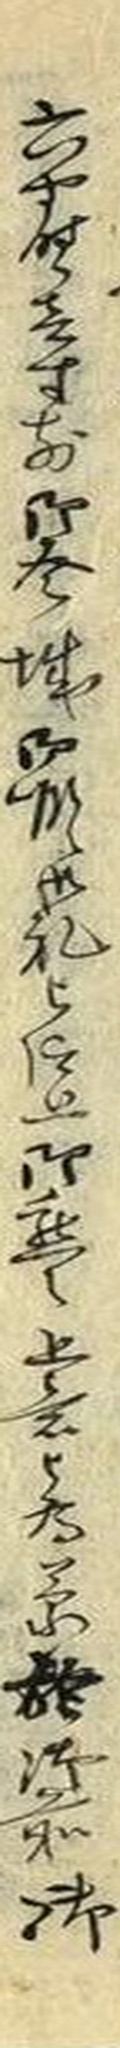六半時へ壱寸前御登城御暇御礼被仰上御懇之上意被為蒙於御前御
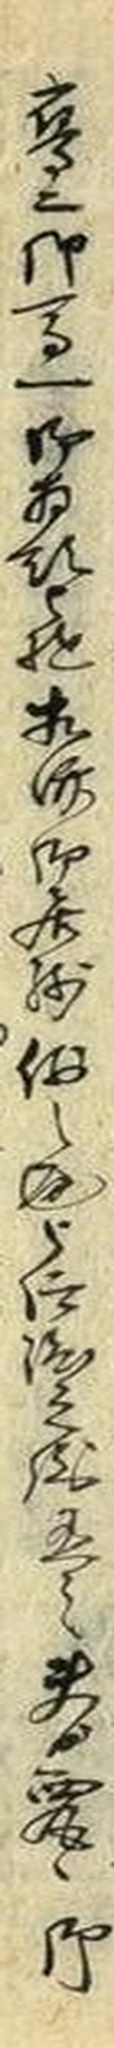鷹二御馬一御拝領被遊相済御居残例之通被仰渡之儀有之夫ゟ西丸へ御
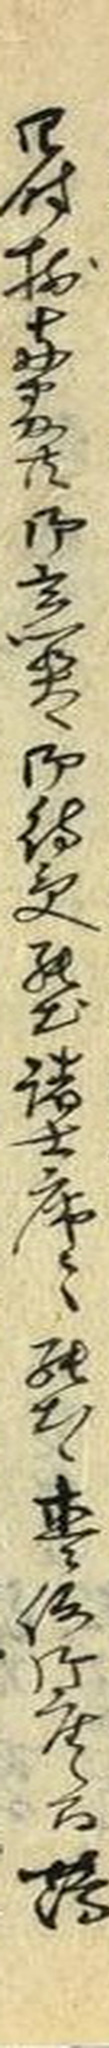四時揃両番共御玄関へ御待受罷出諸士席々罷出候直ニ仮御座之間鶴
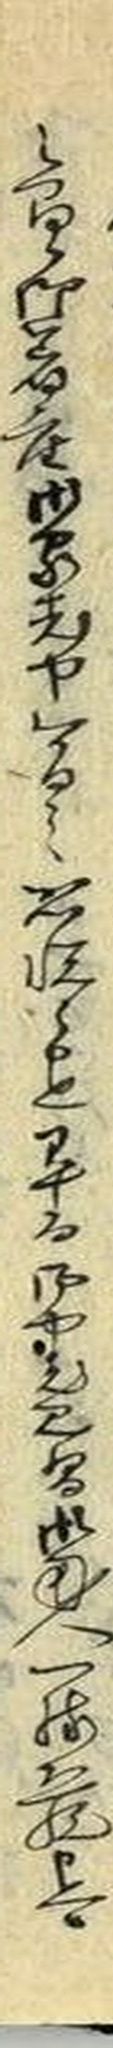之間へ御着座御家老中今日之恐悦被申上畢而御家老見習御用人一統恐悦申上候
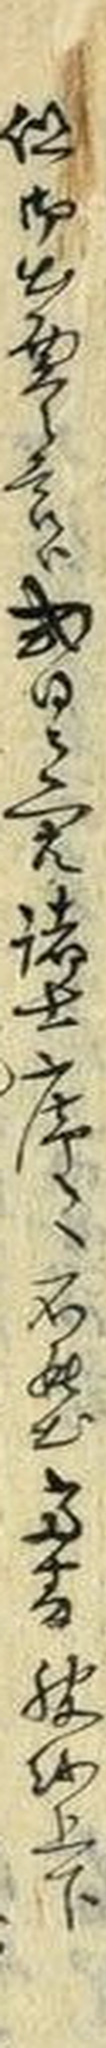但御出殿之節ハ式日ニ候へ共諸士席々不罷出当番服紗上下
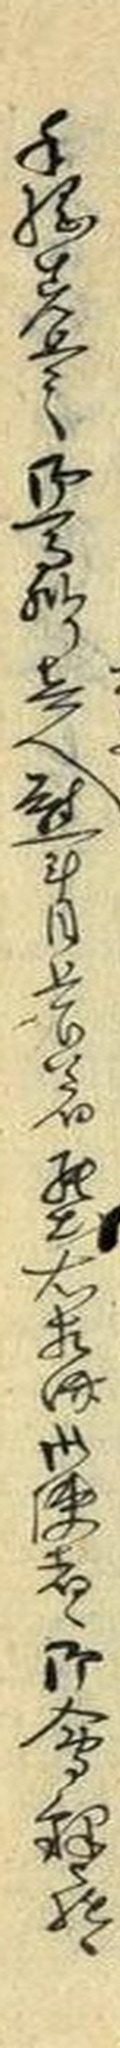手綱差上之御馬掛り壱人熨斗目上下着罷出右相済御使者へ御会釈被遊候
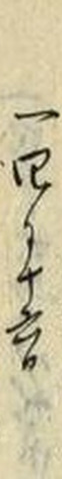一四月十四日
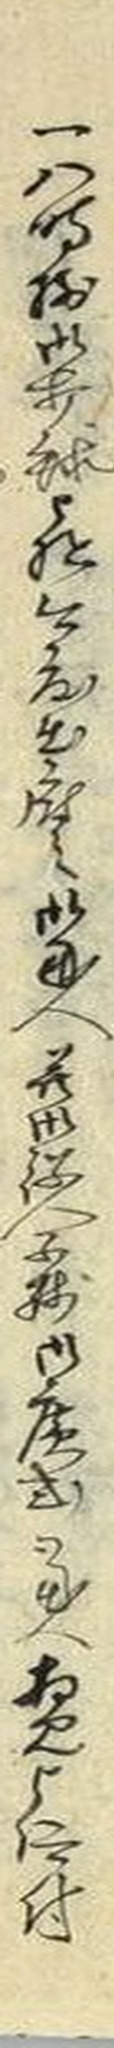一八時揃御打毬被遊今度出府之御用人并御役人不残御広式御用人拝見被仰付
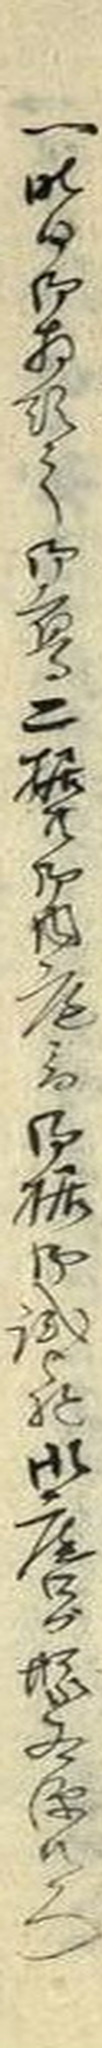一昨日御拝領之御鷹二据共御内庭ニ而御据御試被遊御庭口ゟ塚谷源左衛門
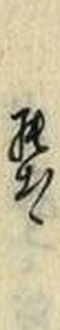罷出候
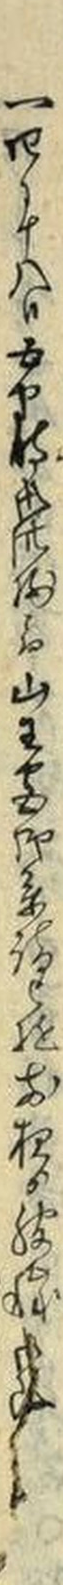一四月十八日五半時御供揃ニ而山王宮御参詣被遊前夜ゟ服穢御改

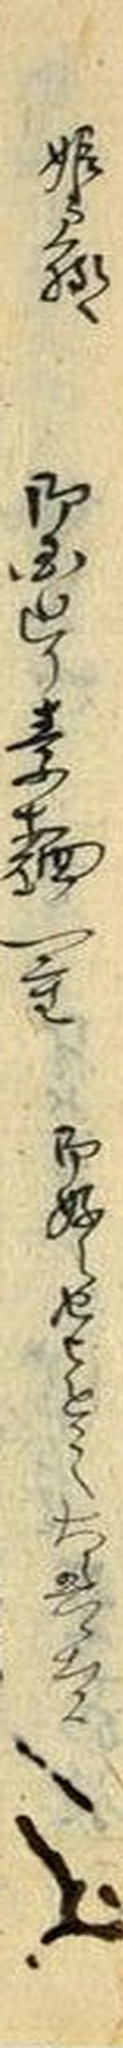姫君様へ御国廻り素麺一重御好之由被進之大奥へ出ス
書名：少傅日録抄（斉承付側向頭取日記、在府）
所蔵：福井県文書館 Fukui Prefectural Archives
